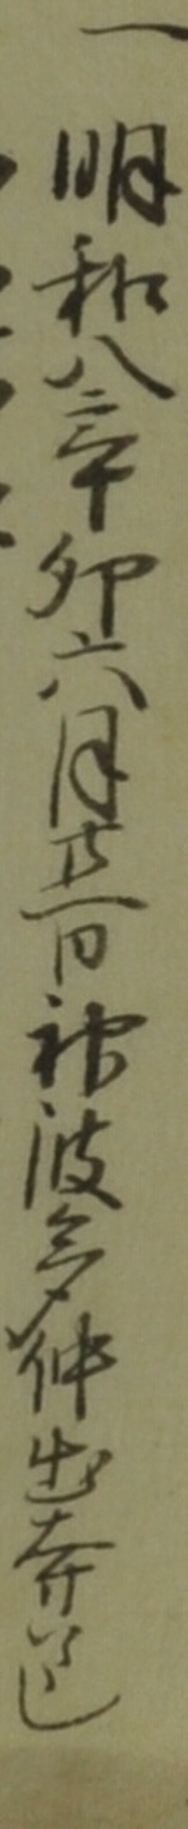一明和八辛卯六月廿一日神波多仲出奔いたし
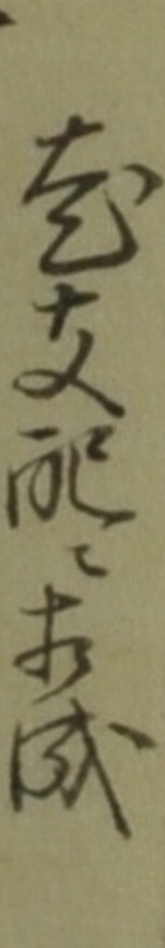老支配ニ相成
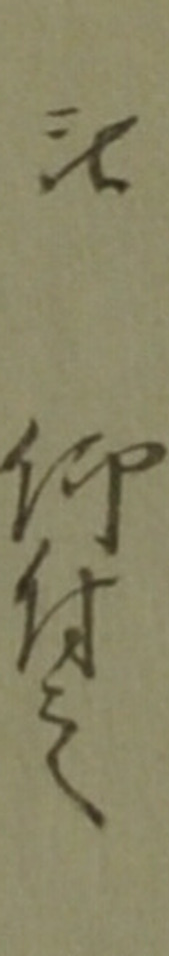被仰付之
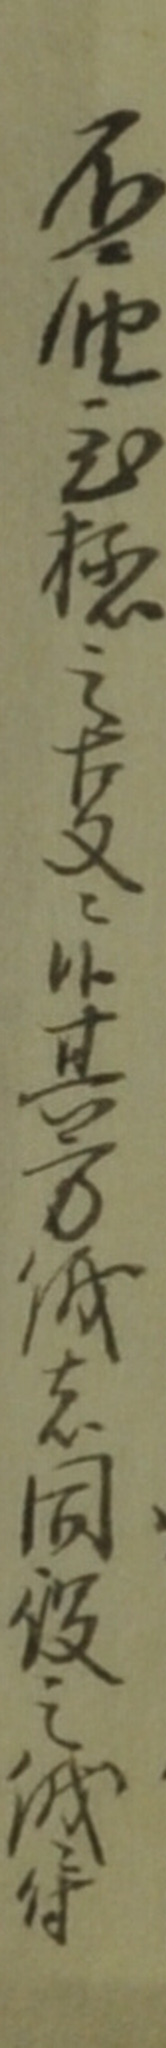不届至極之事ニ候其方俄者同役之儀ニ付
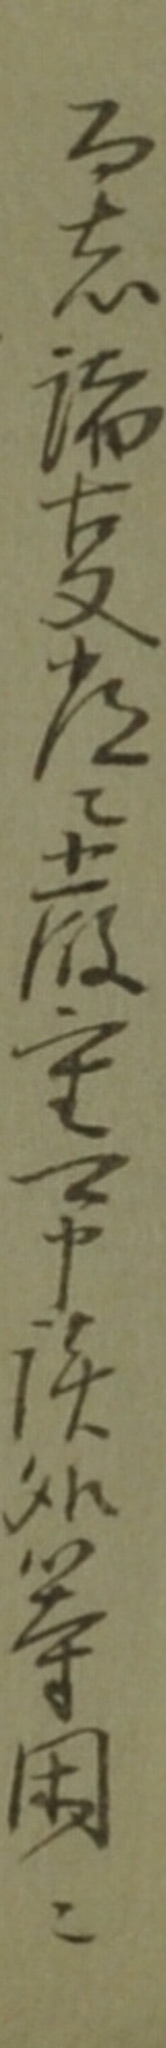而者諸事常ニ厳重可申談処当閑ニ
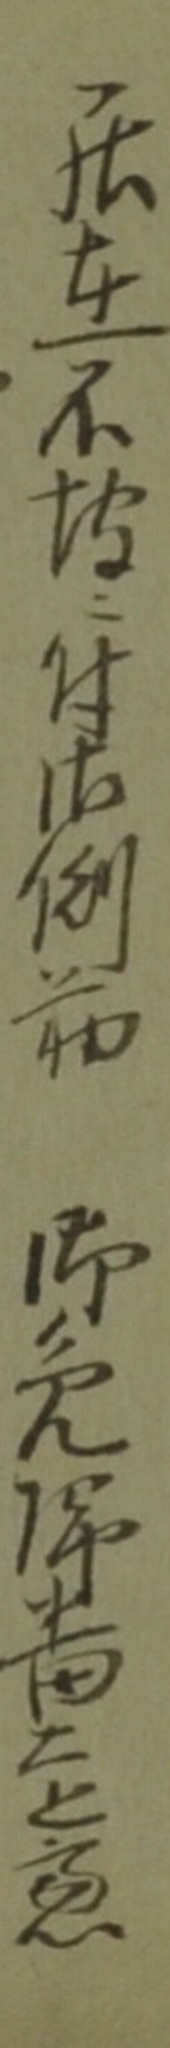罷在不埒ニ付御側勤御免帰番遠慮
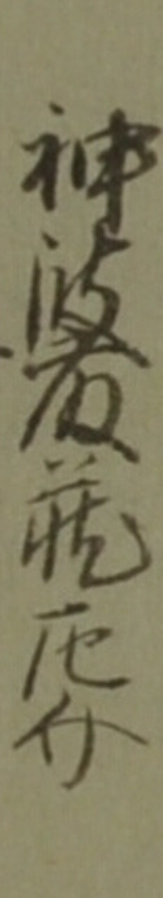神波藤蔵厄介
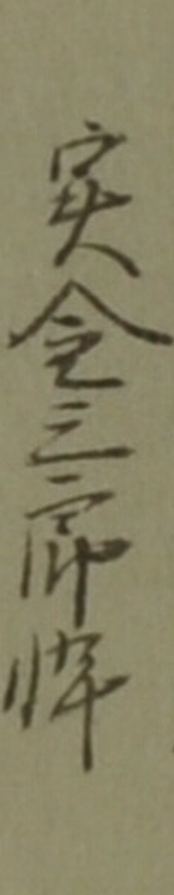実金三郎忰
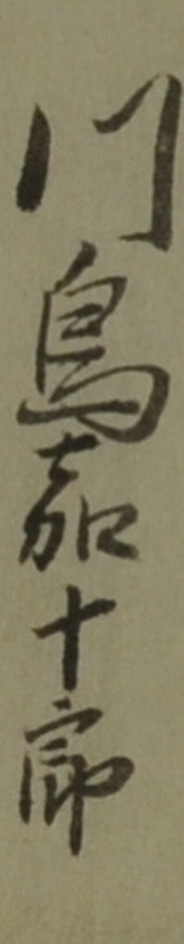川島嘉十郎
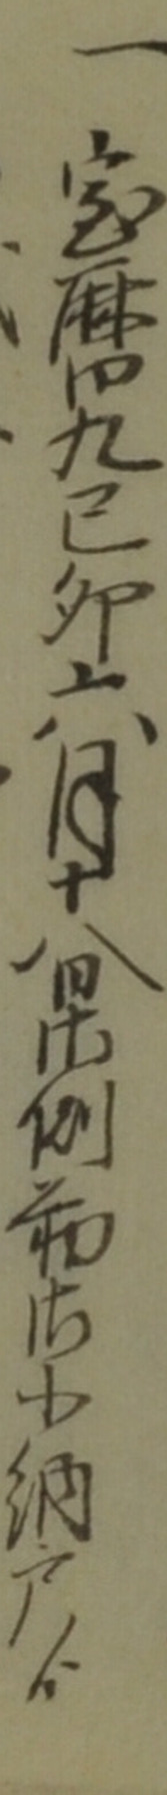一宝暦九己卯六月十八日御側勤御御小納戸ゟ
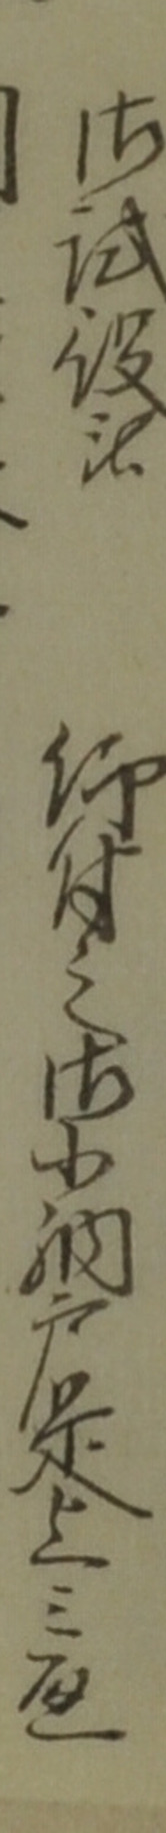御試役被仰付之御小納戸是迄之通
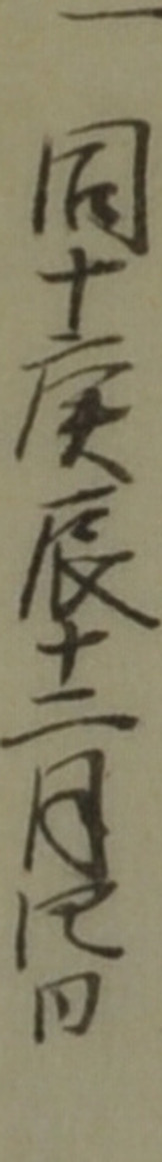一同十庚辰十二月四日
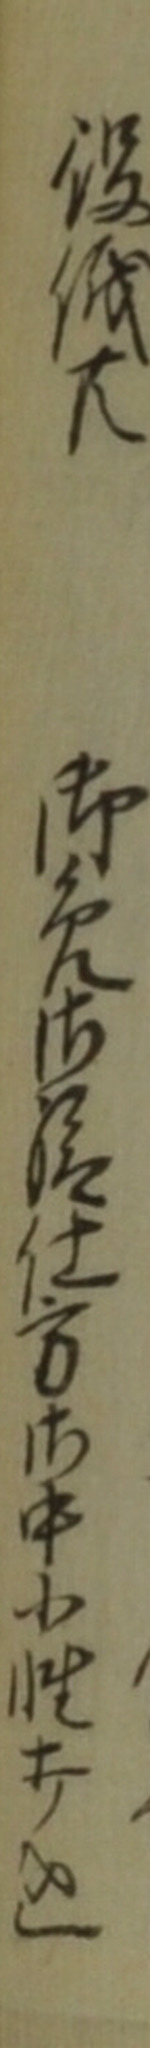役儀共御免御給仕方御中小性打込
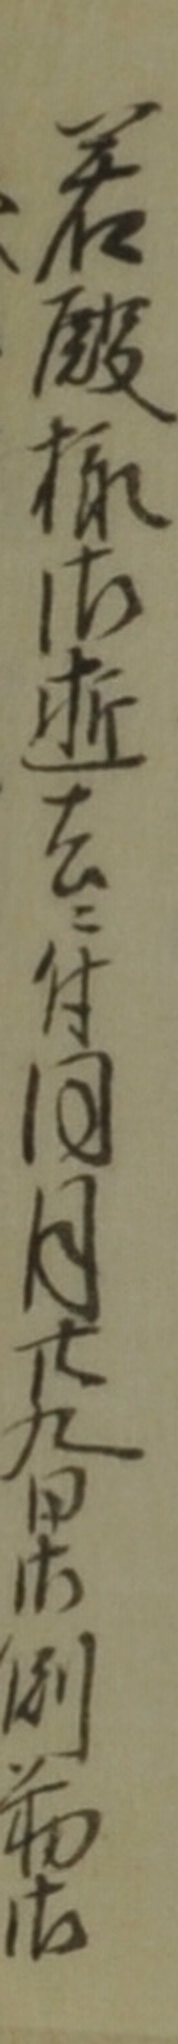若殿様御逝去ニ付同月廿九日御側勤御
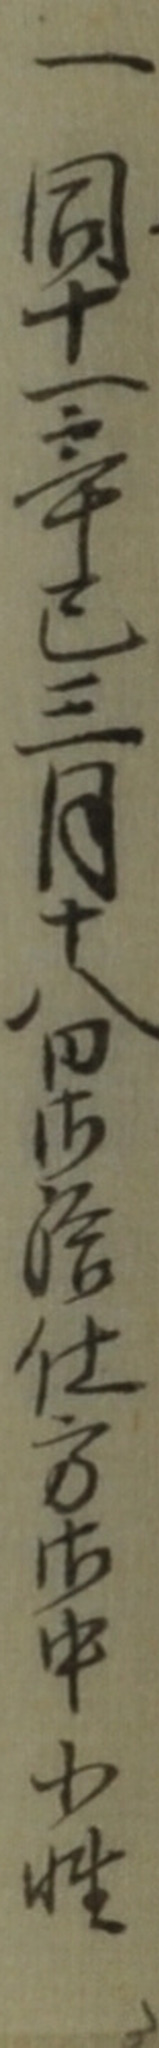一同十一辛巳三月十八日御給仕方中小性
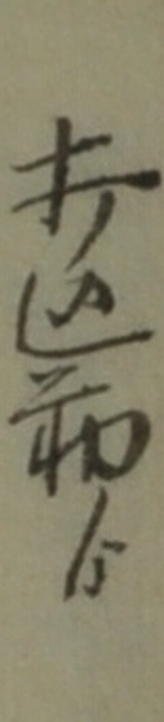打込勤ゟ
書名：諸御役代々録（四）
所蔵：伊那市立高遠町図書館・合同会社AMANE
